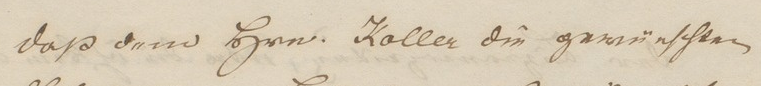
daß dem Hrn. Koller die gewünschten
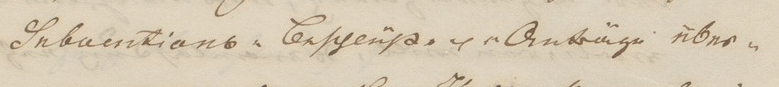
Subventions–Beschlüße & –Anträge über-
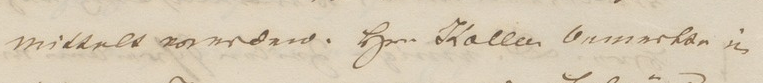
mittelt werden. Hrn. Koller bemerkte in
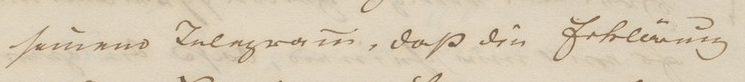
seinem Telegramm, daß die Erklärung
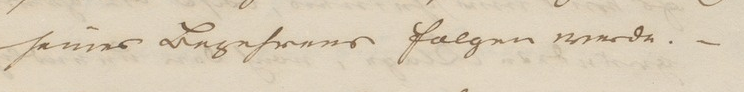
seines Begehrens folgen werde. –
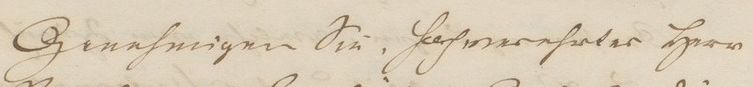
Genehmigen Sie, hochverehrter Herr
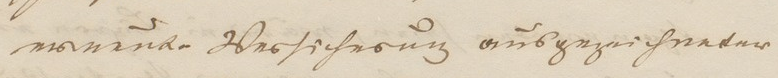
erneute Versicherung ausgezeichneter
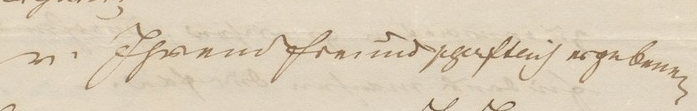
v. Ihrem freundschaftlich ergebenen
